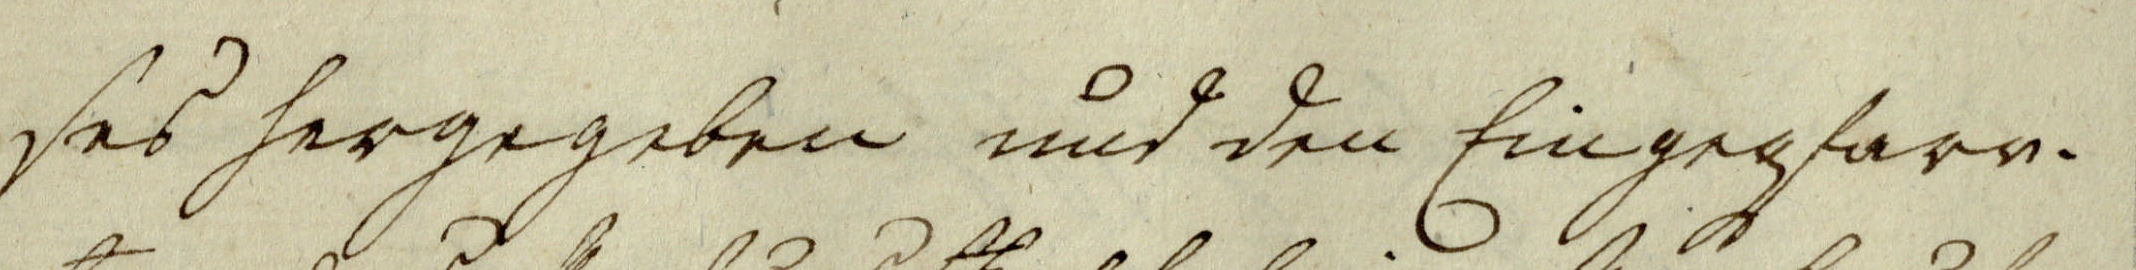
ses hergegeben und den Eingepfarr¬
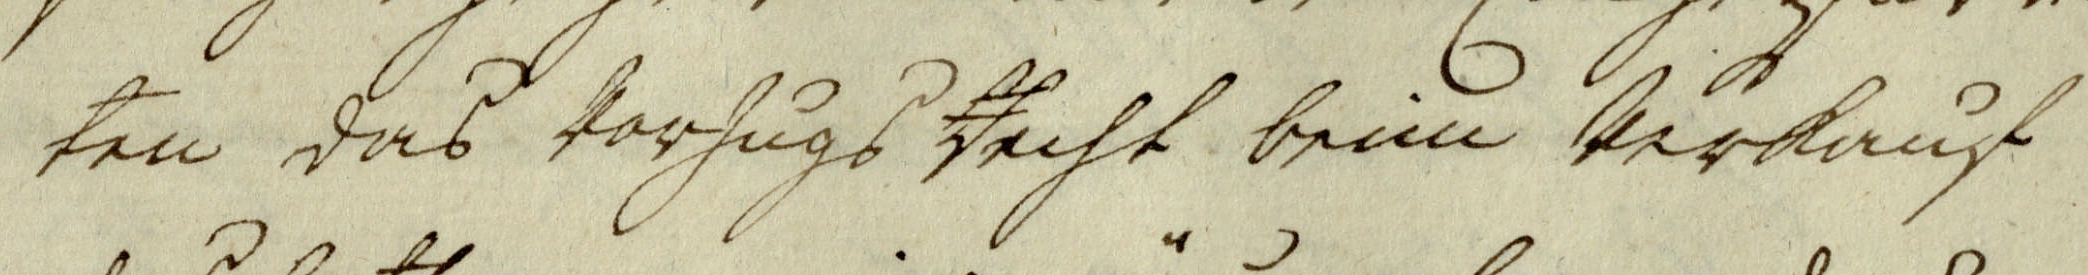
ten das Vorzugs Recht beim Verkauf
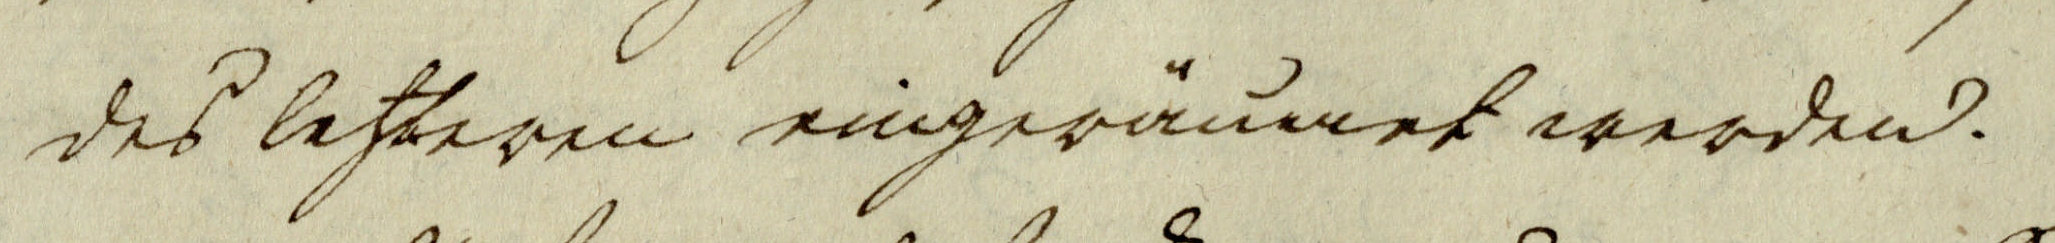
des letzteren eingeräumet werden.
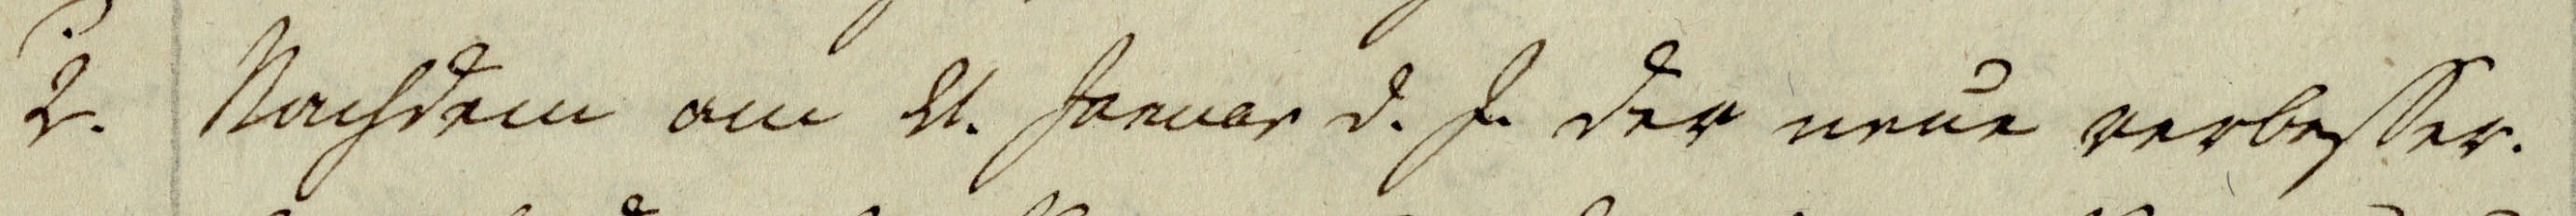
2. Nachdem am 21. Januar d. J. der neue verbesser¬
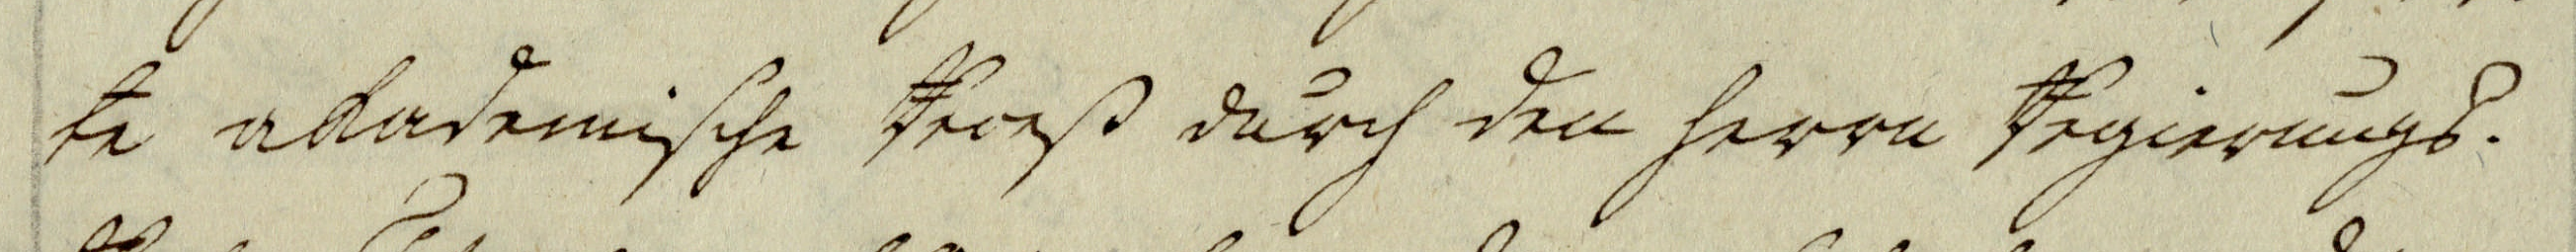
te akademische Receß durch den Herrn Regierungs
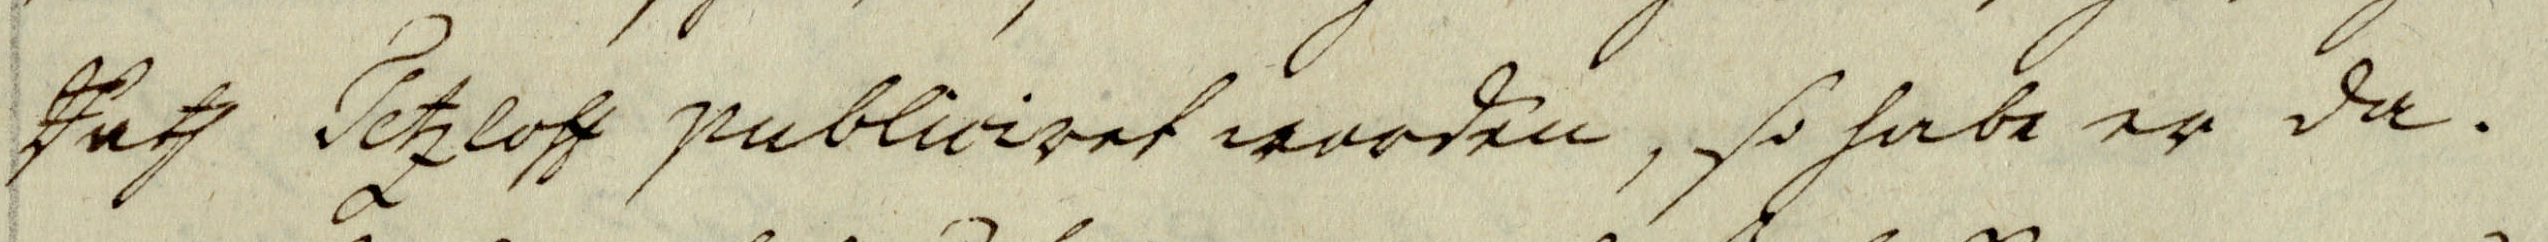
Rath Tetzloff publiciret worden, so habe er da¬
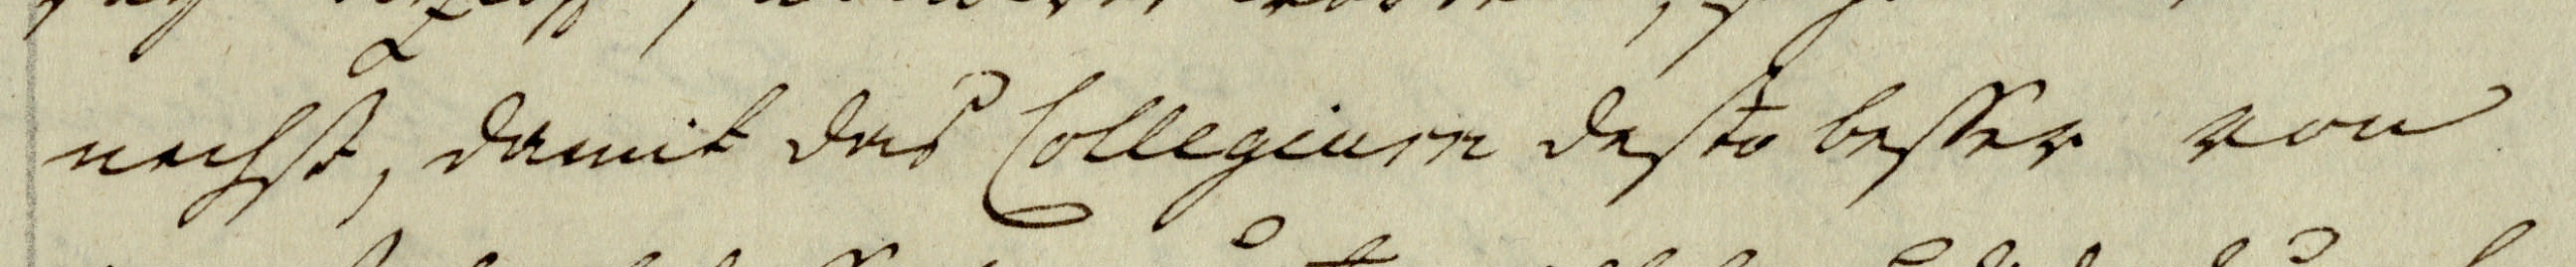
nechst, damit das Collegium desto besser von
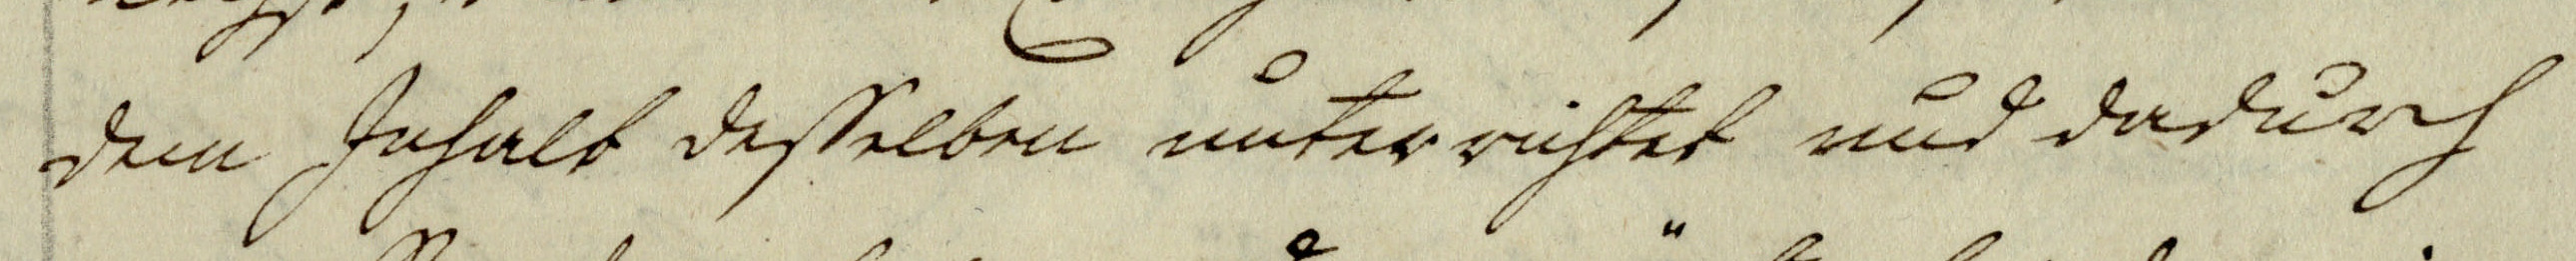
dem Inhalt desselben unterrichtet und dadurch
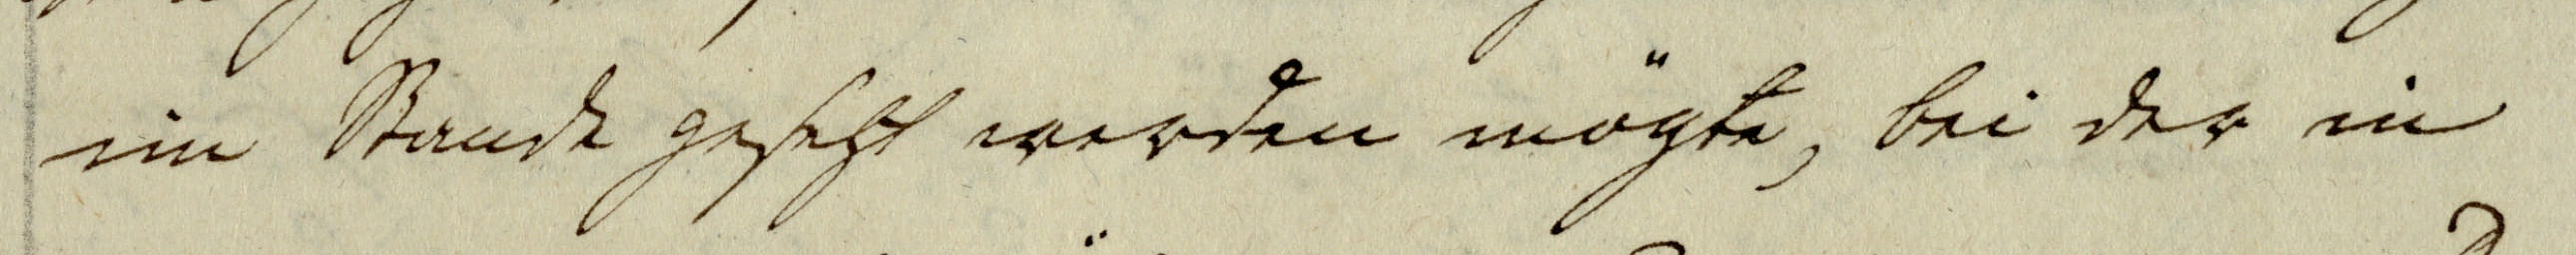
im Stande gesetzt werden mögte, bei der in
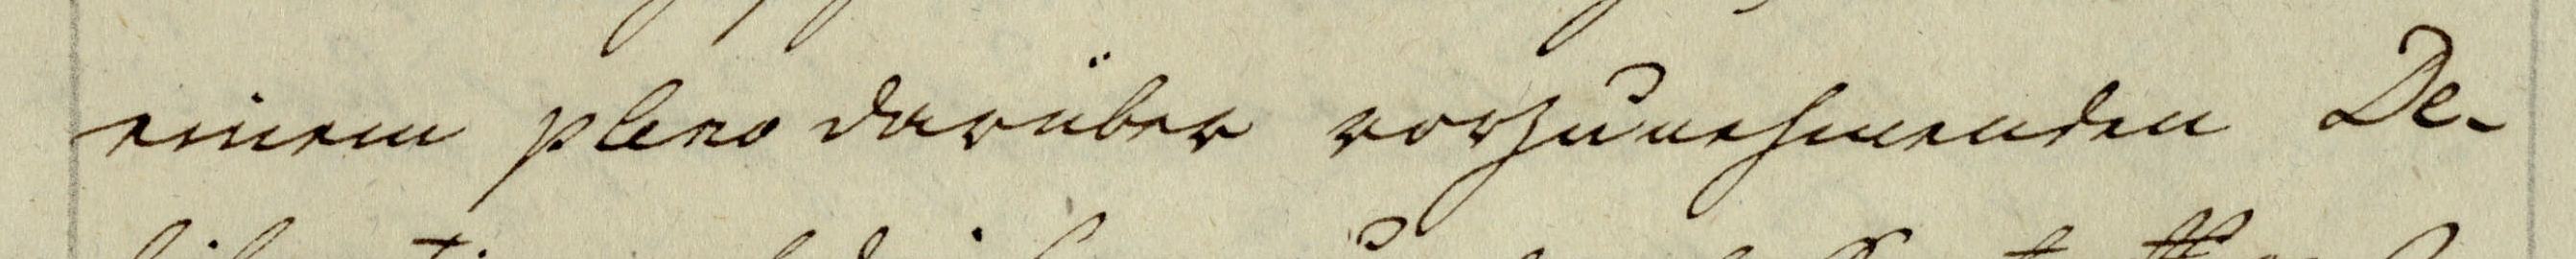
einem pleno darüber vorzunehmenden De¬
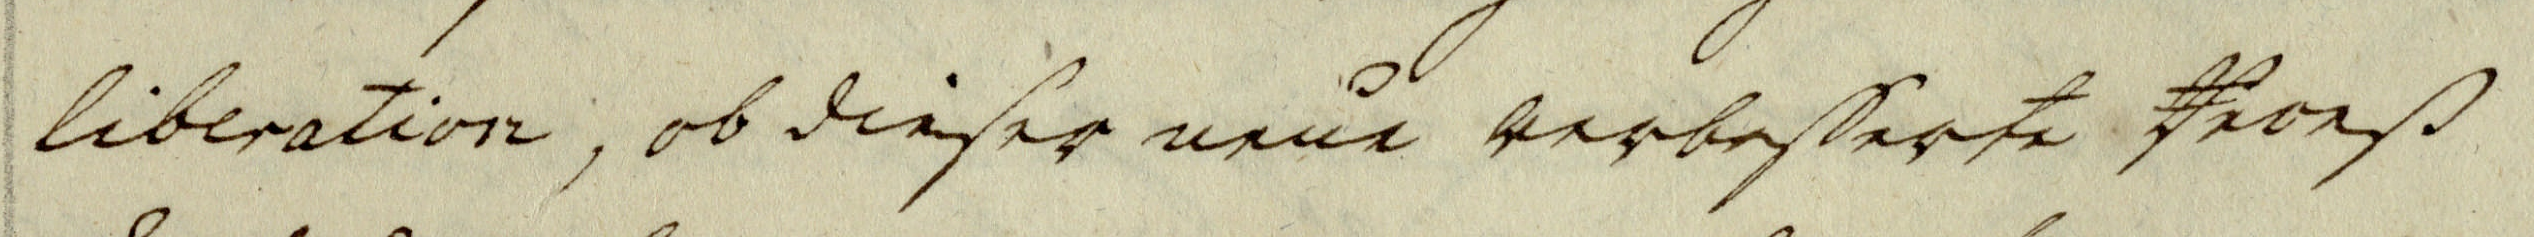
liberation, ob dieser neue verbesserte Receß
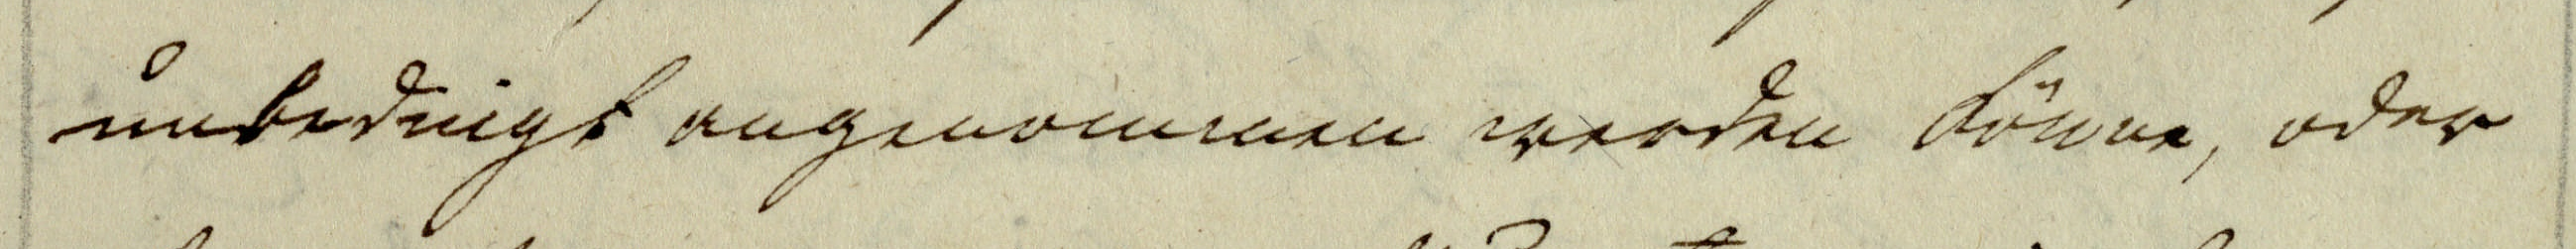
unbedingt angenommen werden könne, oder
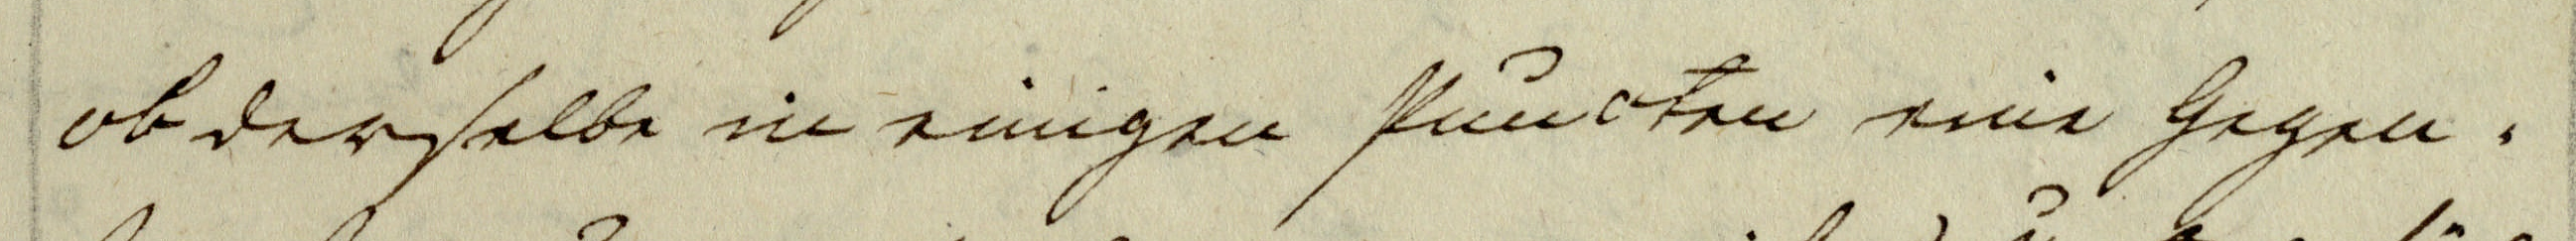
ob derselbe in einigen Punkten eine Gegen¬
